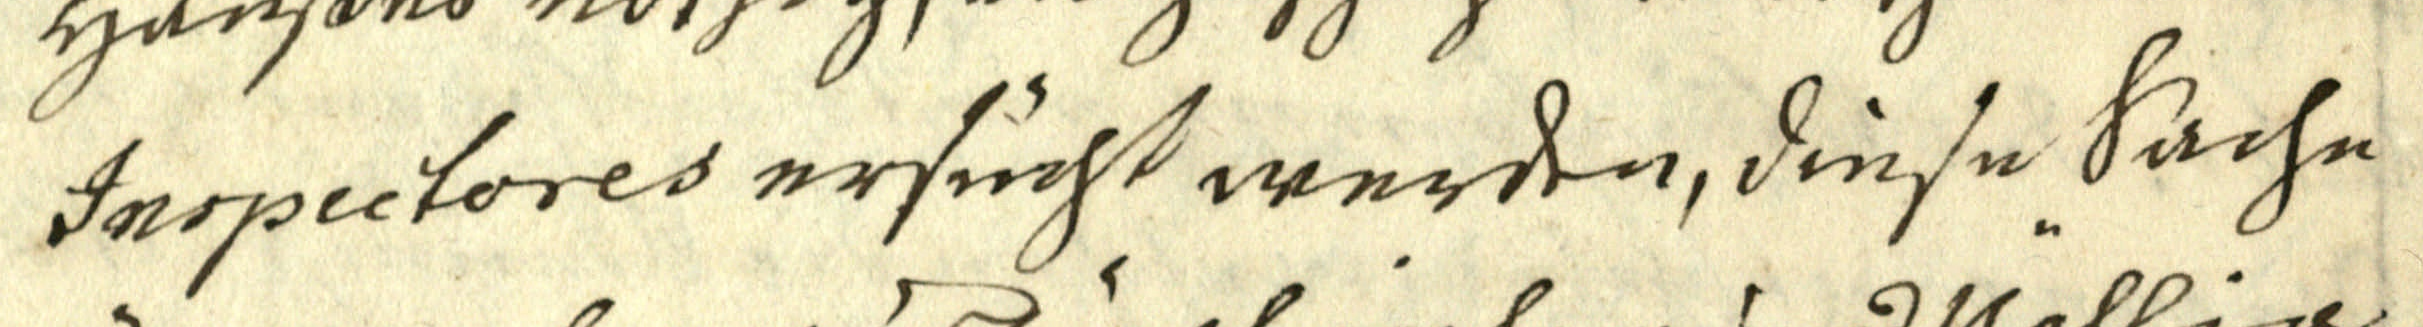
Inspectores ersucht werden, diese Sache
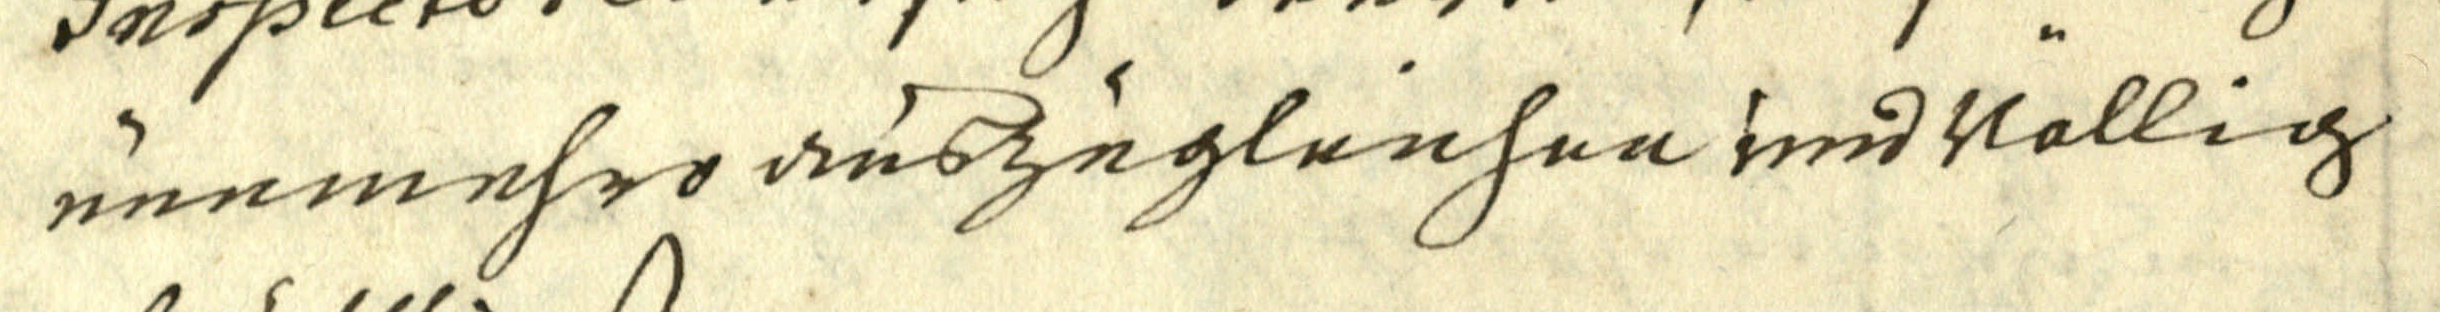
nunmehro auszugleichen und völlig
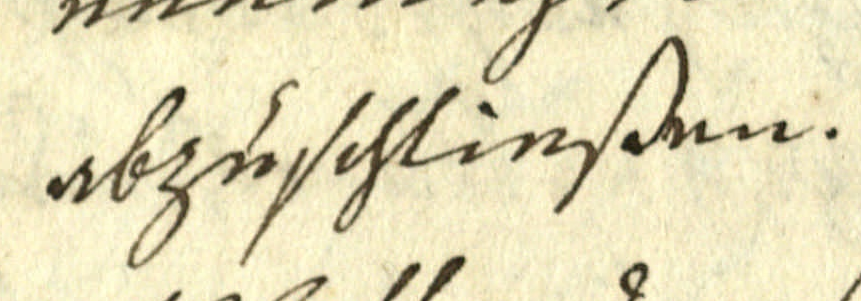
abzuschliessen.
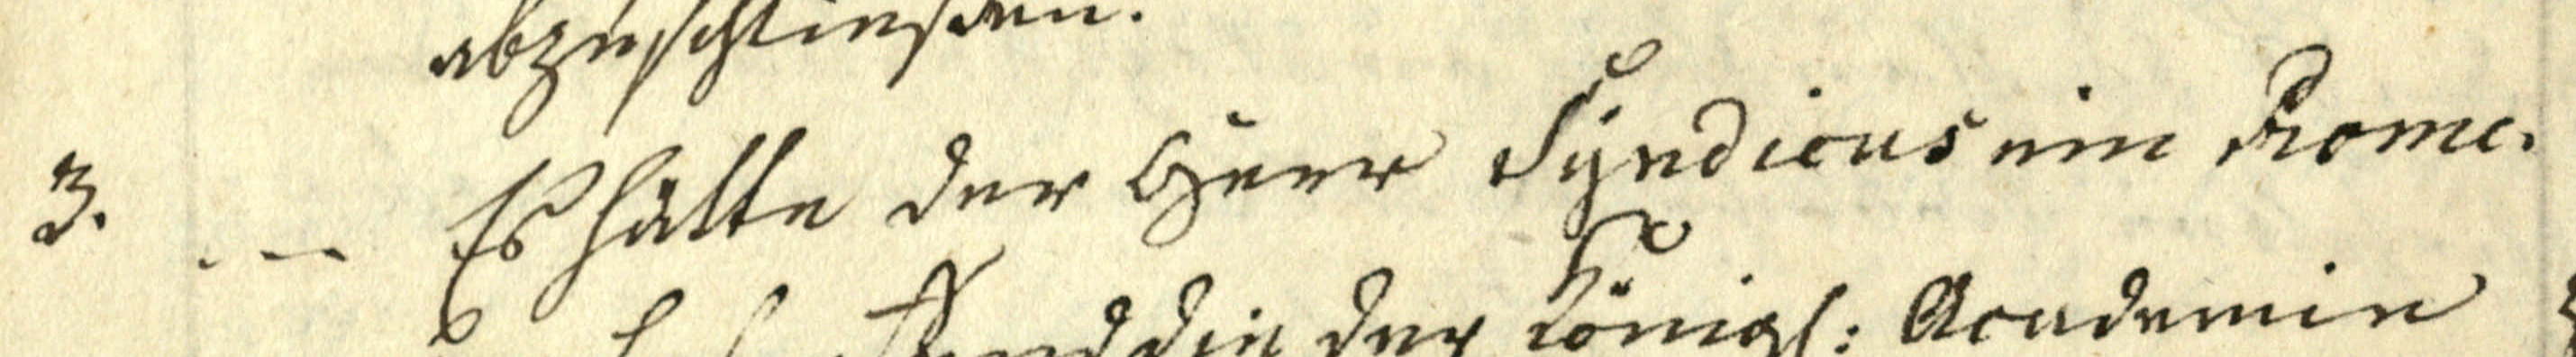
3. Es hätte der Herr Sÿndicus ein Prome¬
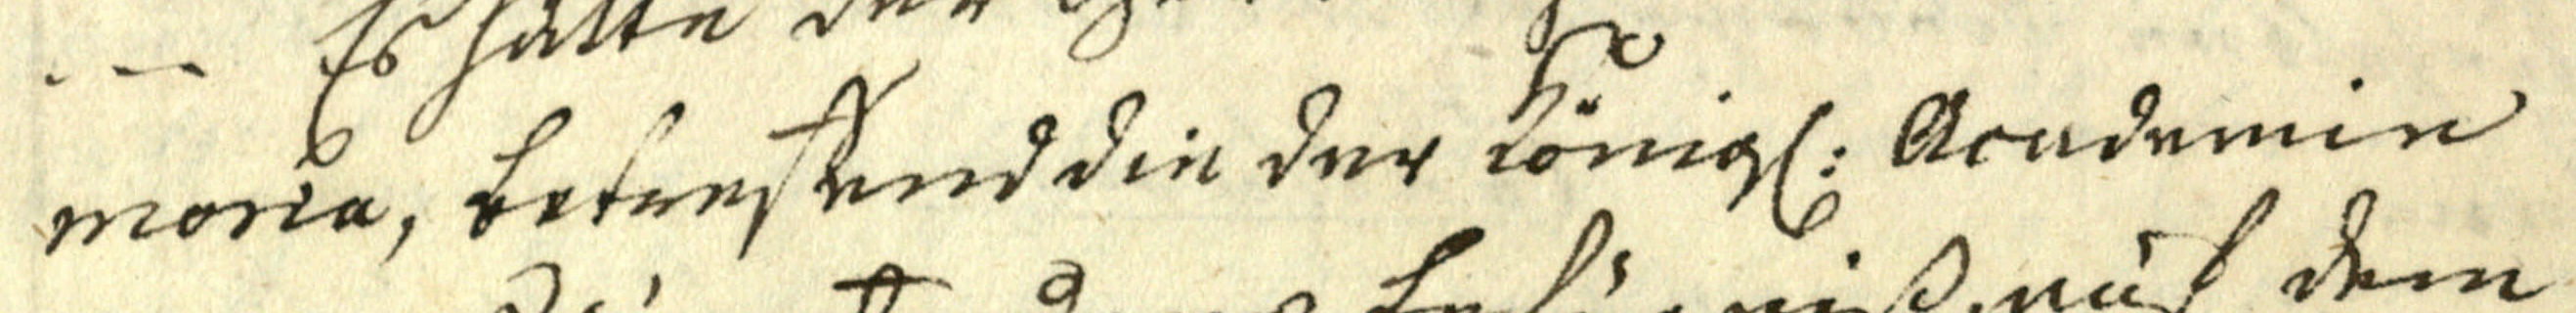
moria, betreffend die der Königl. Academie
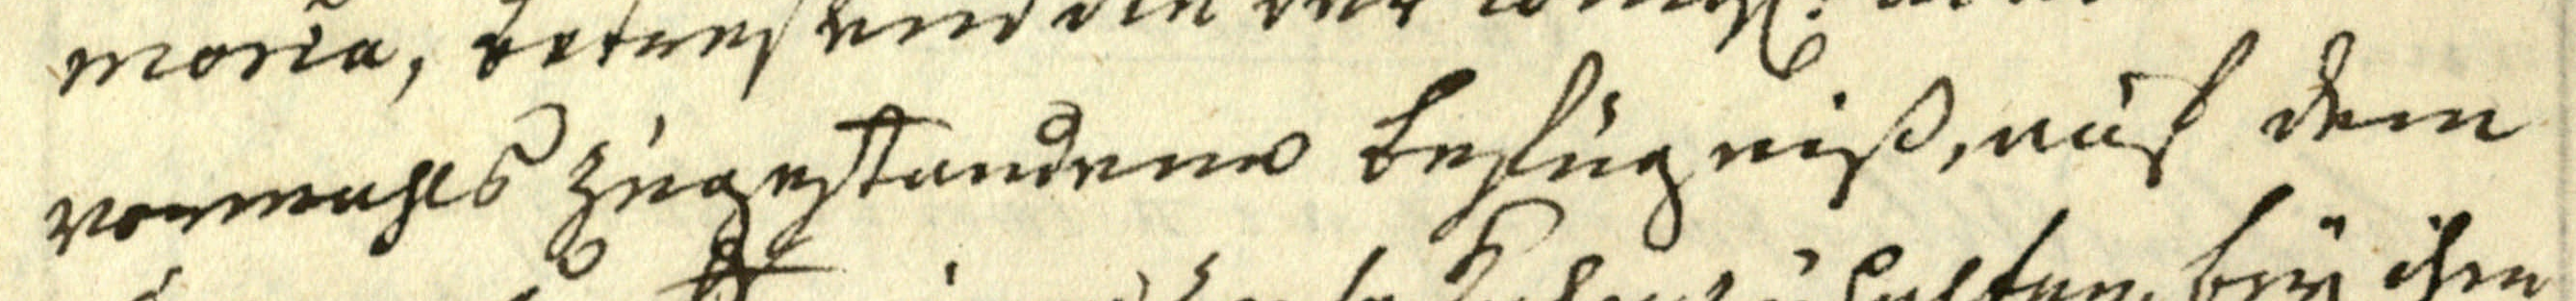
vormahls zugestandene Befugniß, auf dem
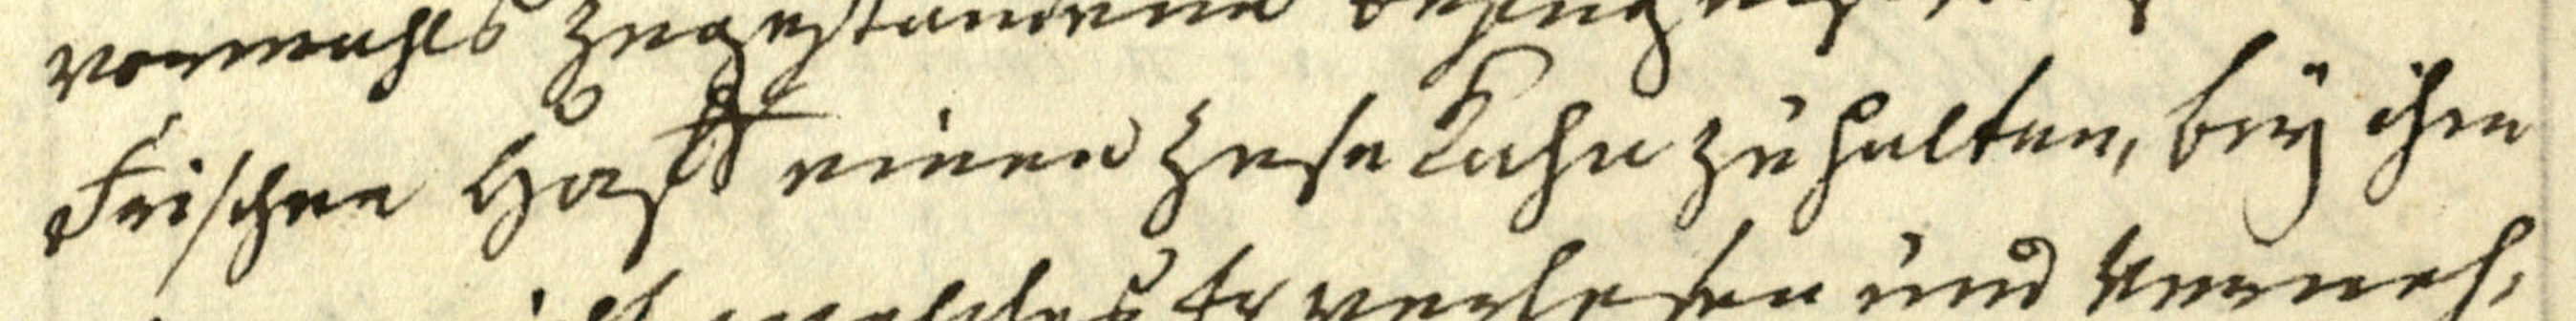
Frischen Haff einen Zesekahn zu halten, beÿ ihm
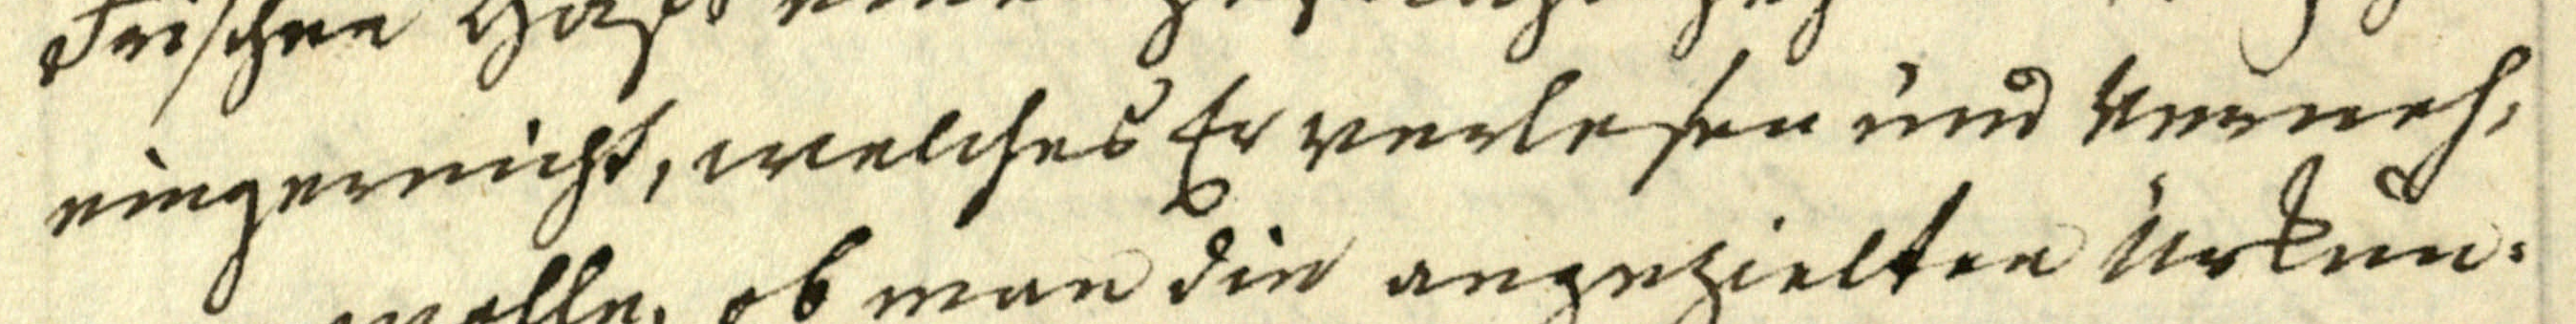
eingereicht, welches Er verlesen und verneh¬
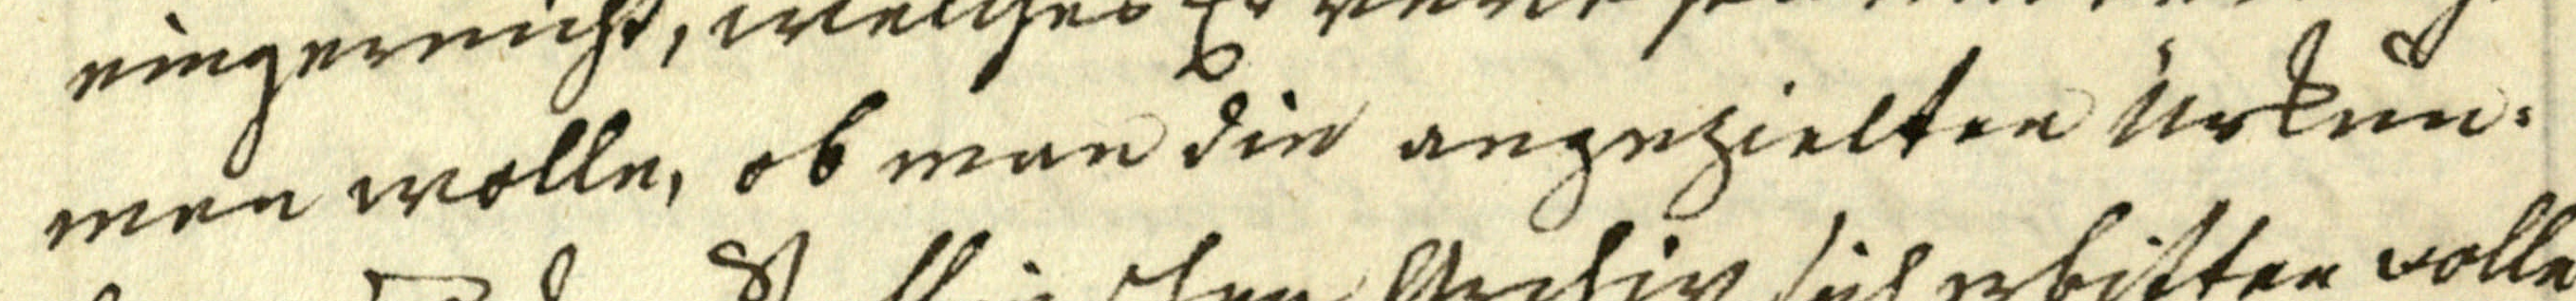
men wolle, ob man die angezielten Urkun¬
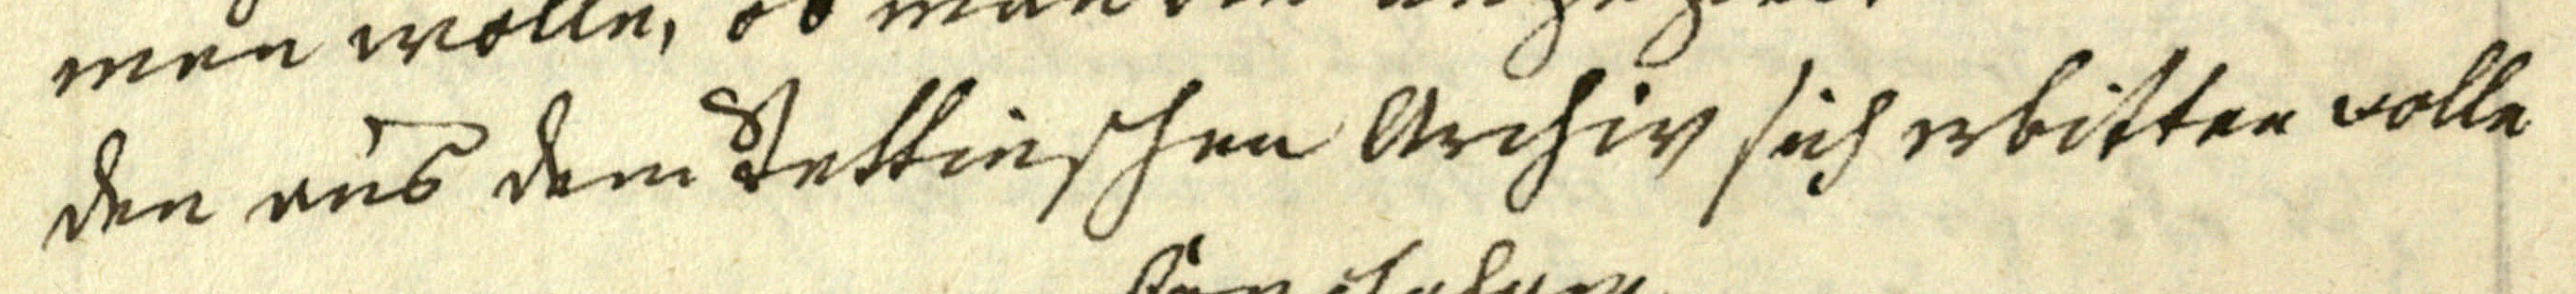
den aus dem Stettinschen Archiv sich erbitten wolle.
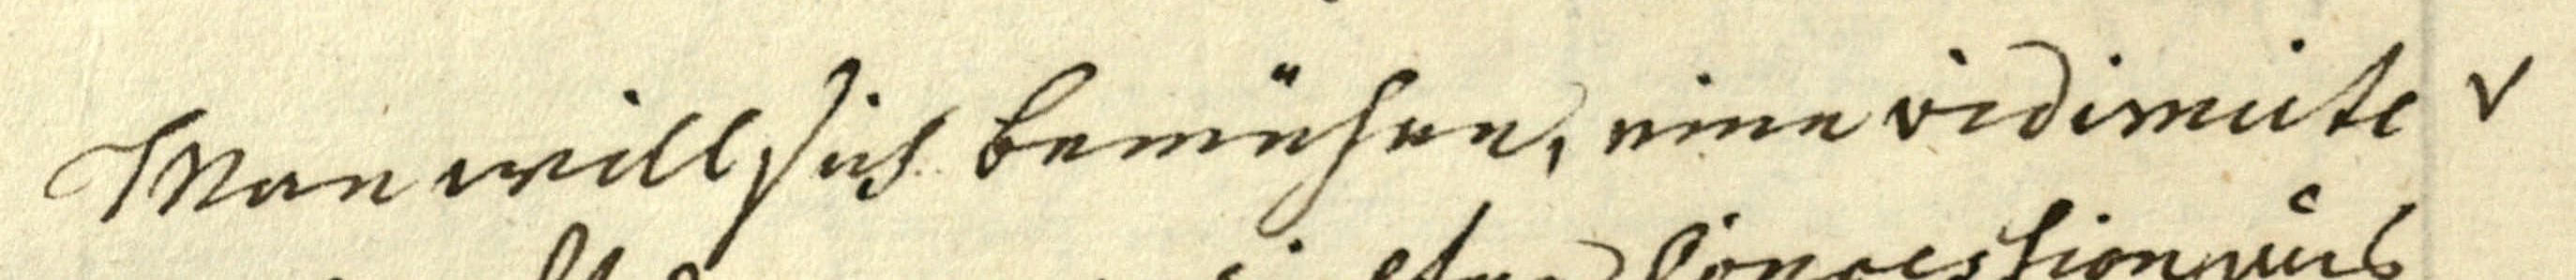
Man will sich bemühen, eine vidimirte
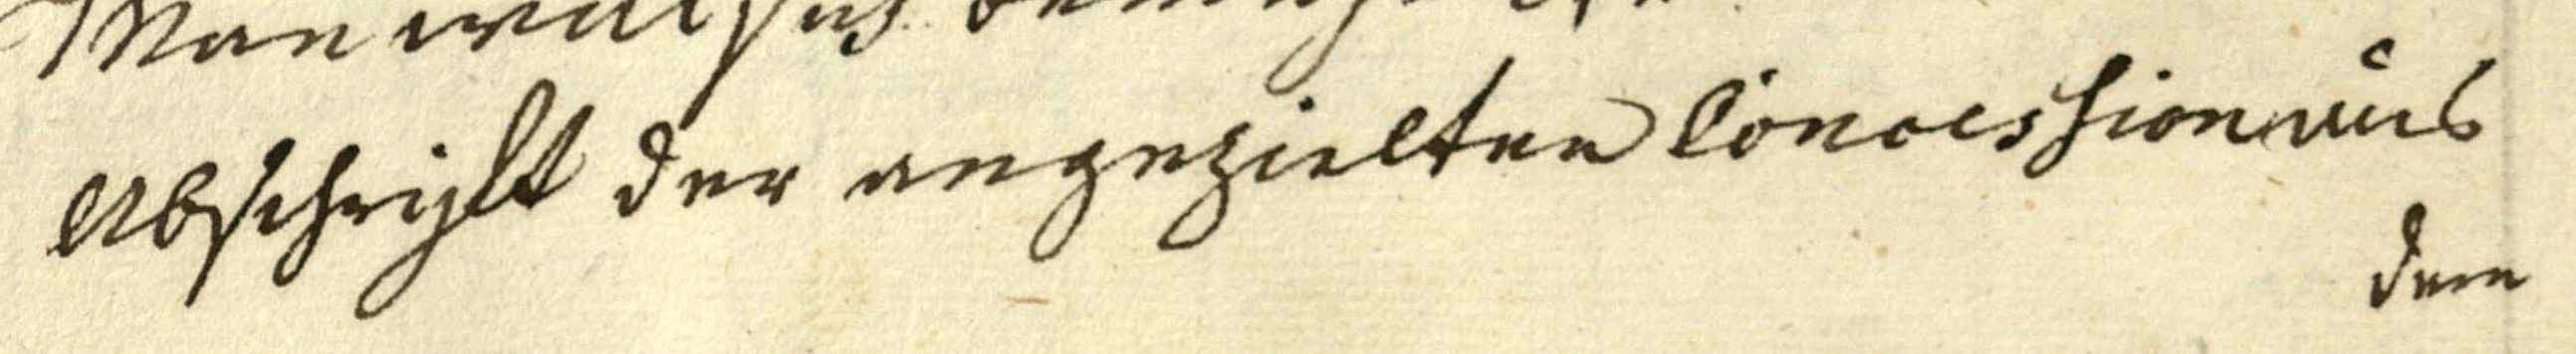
Abschrift der angezielten Concession aus
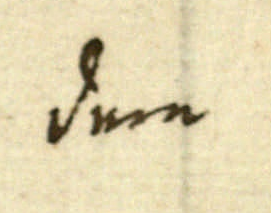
dem
